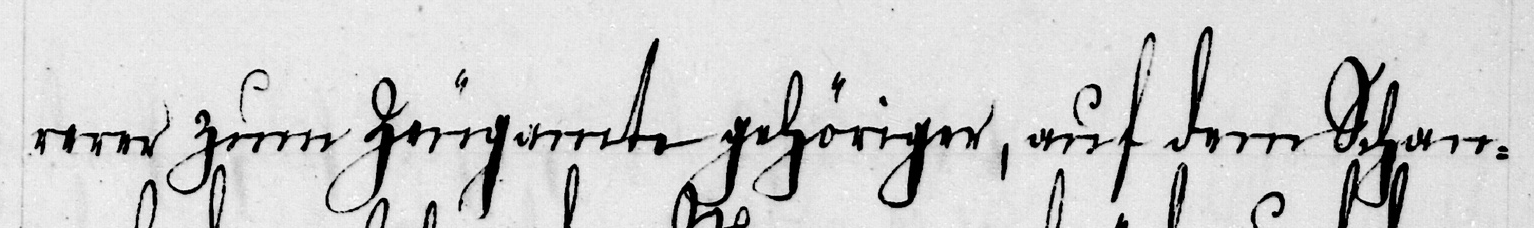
rerer zum Zeugamte gehöriger, auf dem Schan¬
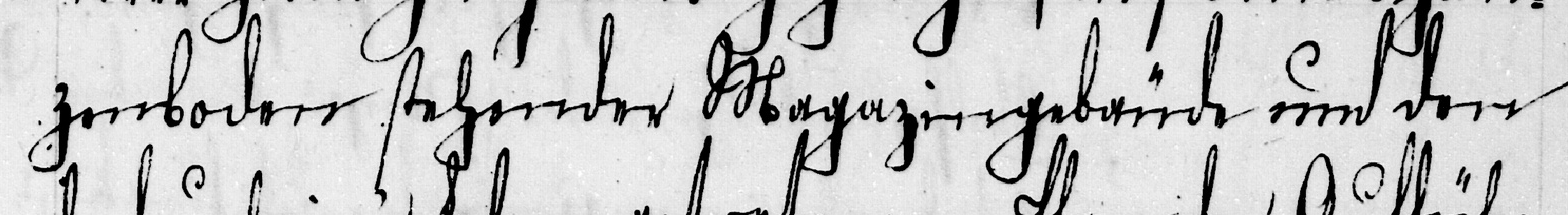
zenboden stehender Magazingebäude und den
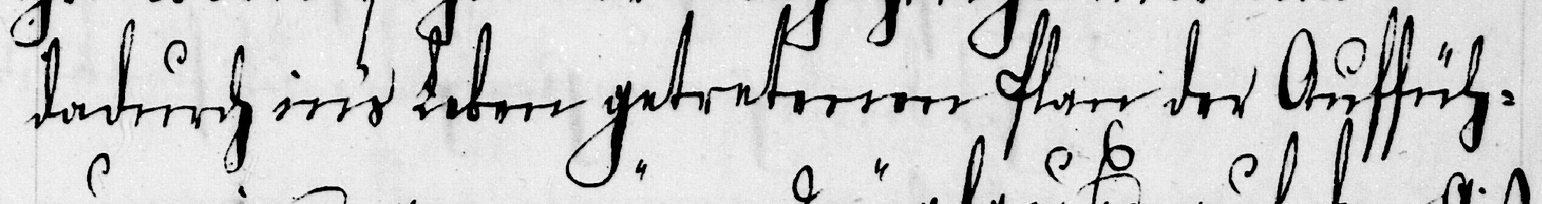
dadurch ins Leben getretenen Plan der Auffüh¬
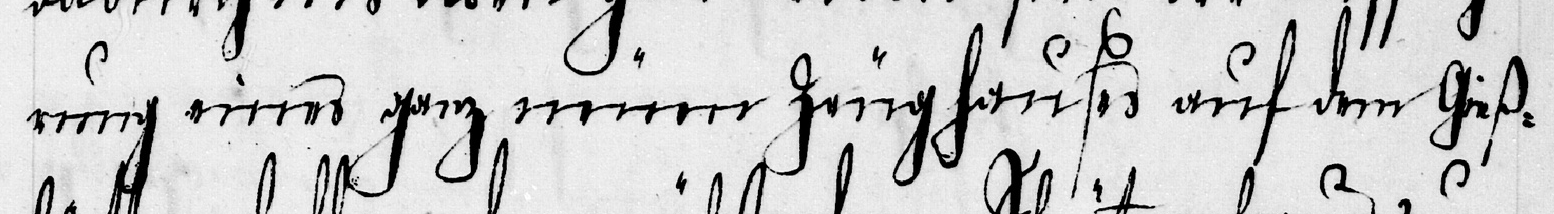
rung eines ganz neuen Zeughauses auf dem Gieß¬
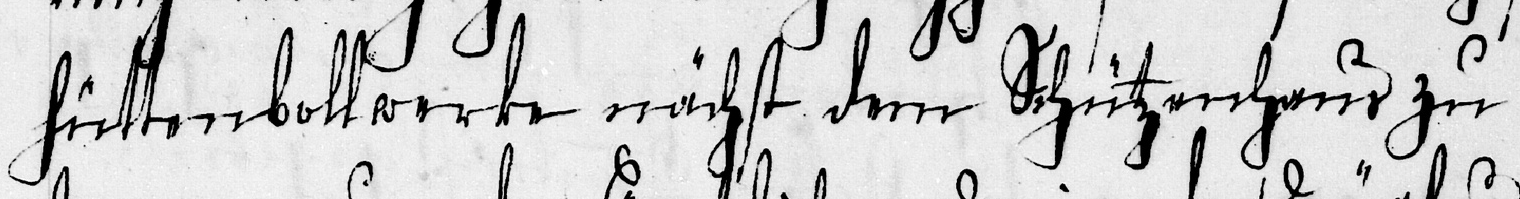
hüttenbollwerke nächst dem Schützenhaus zu
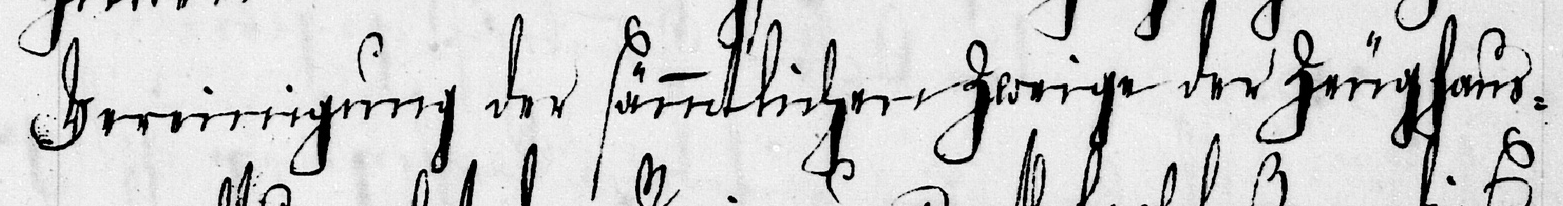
Vereinigung der sämmtlichen Zweige der Zeughaus¬
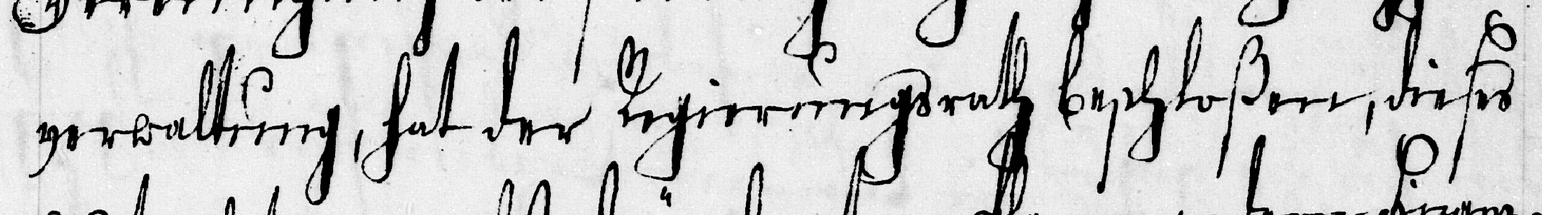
verwaltung, hat der Regierungsrath beschloßen, dieses
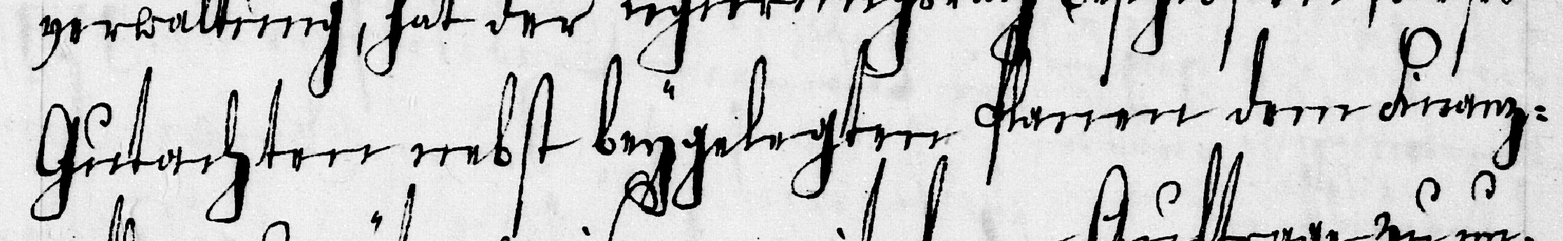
Gutachten nebst beygelegten Planen dem Finanz¬
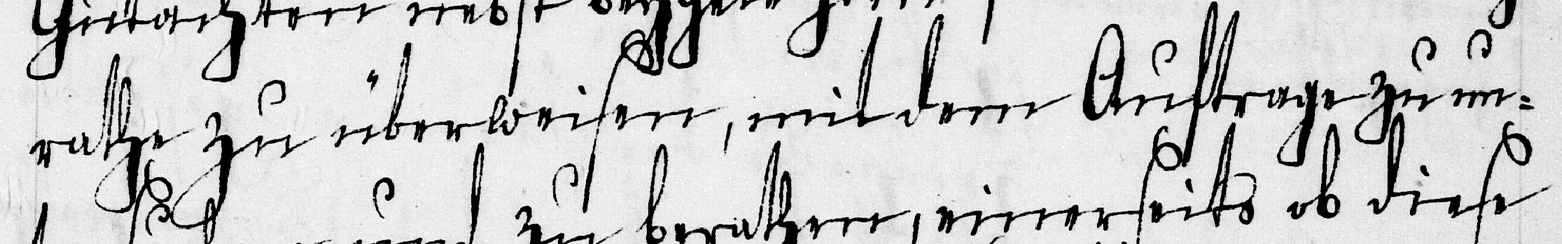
rathe zu überweisen, mit dem Auftrage zu un¬
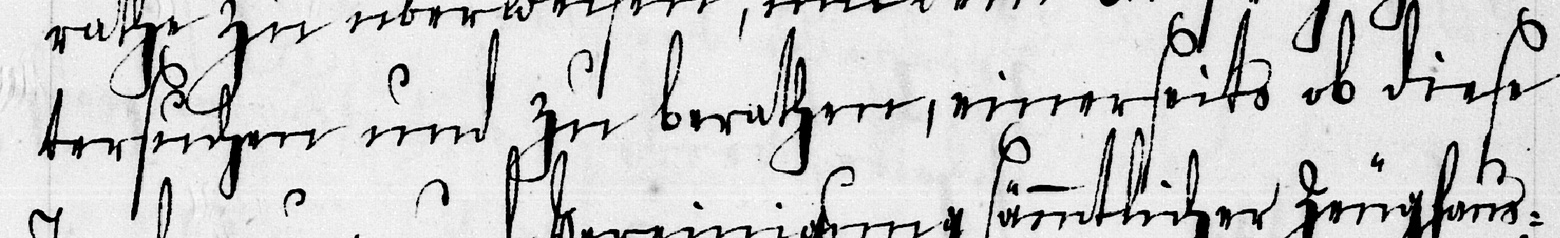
tersuchen und zu berathen, einerseits ob diese
